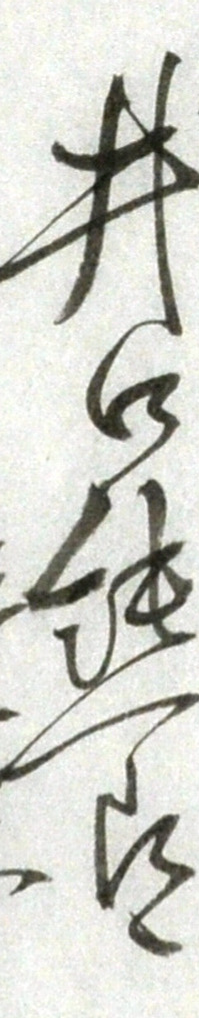井口純一郎
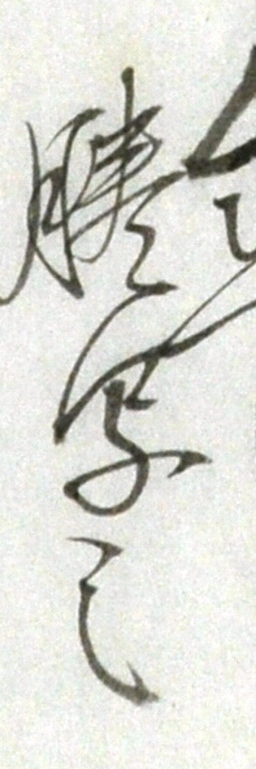謄写之
